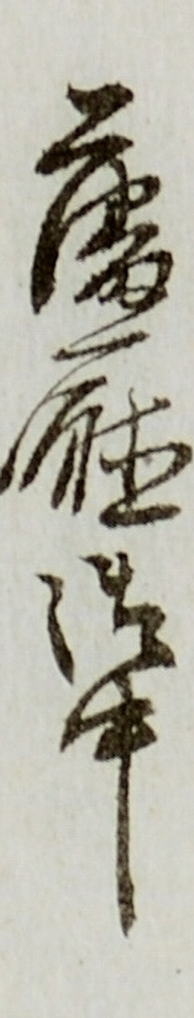藩庁御中
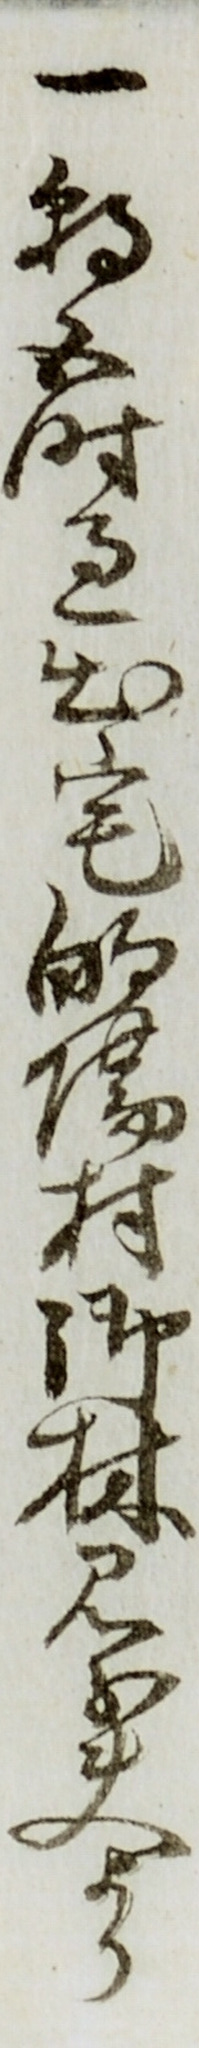一朝五時過出宅的場村御林見分夫より
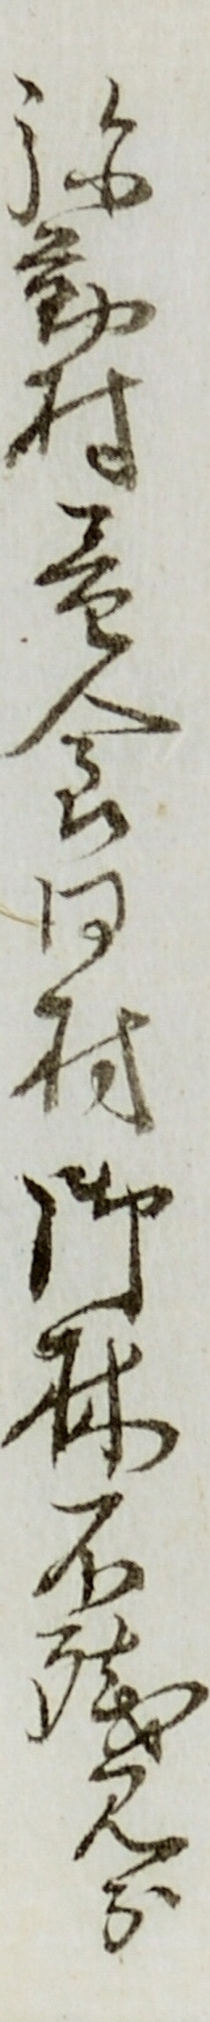弥勒村昼食同村御林不残見分
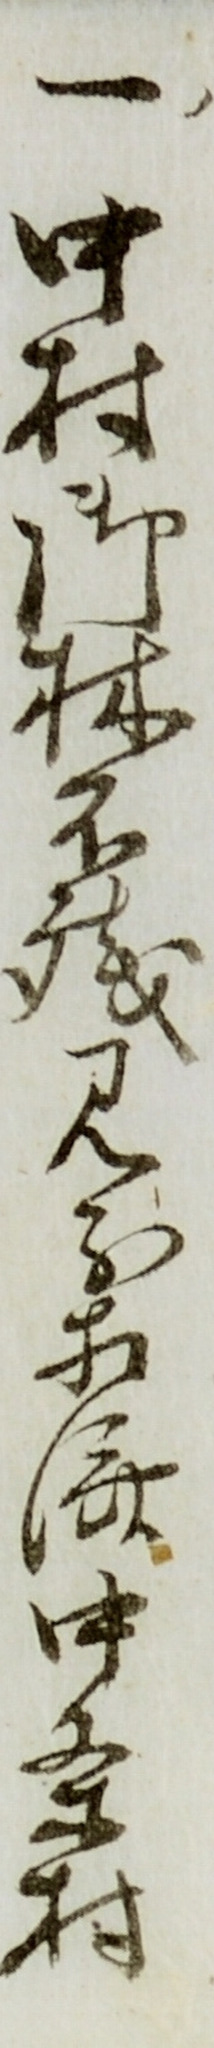一中村御林不残見分相済中条村
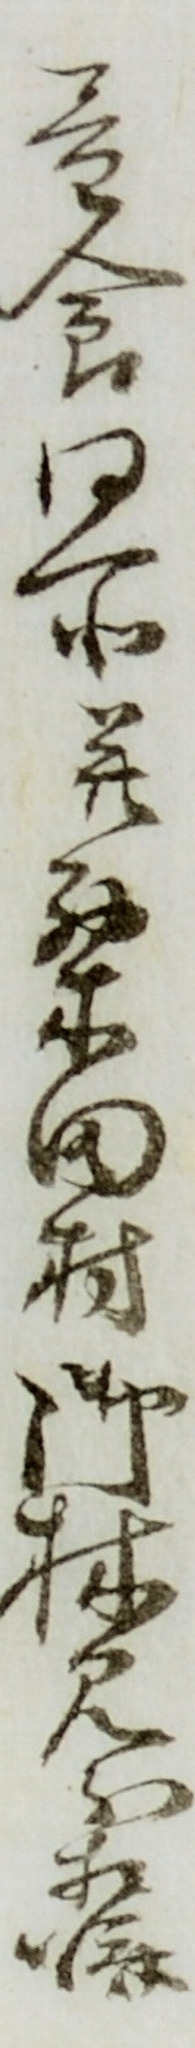昼食同所幷栗田村御林見分相済
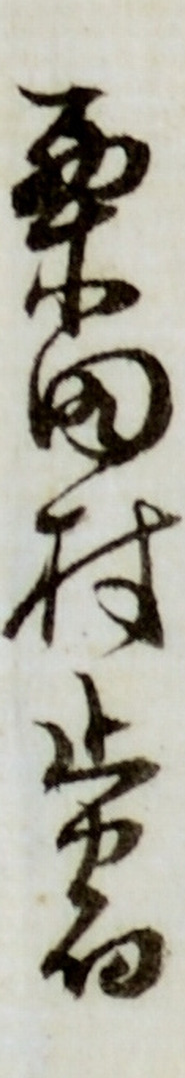栗田村止宿
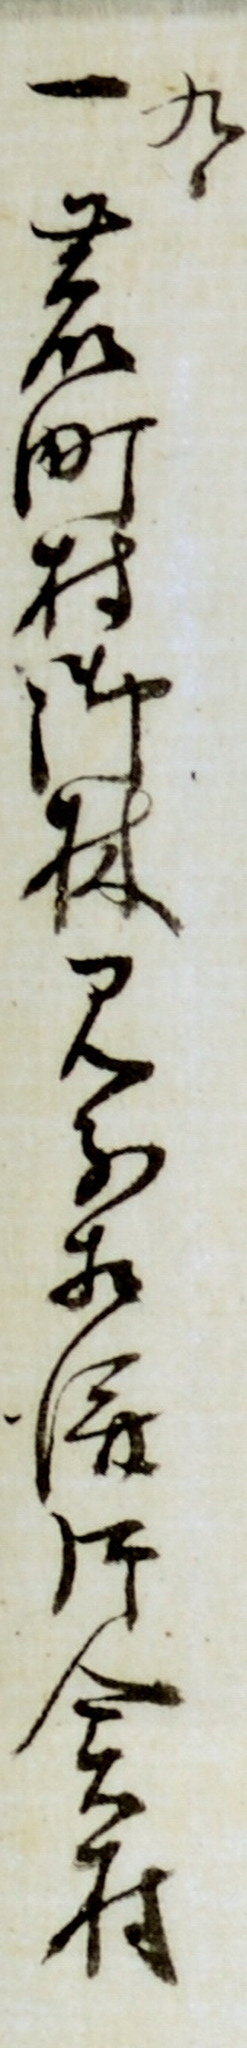一荒町村御林見分相済片倉村

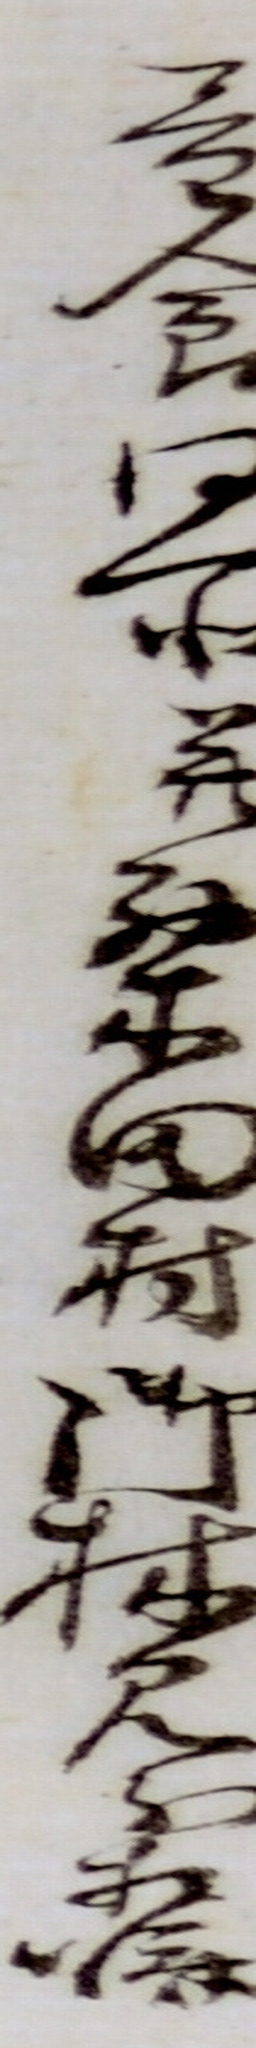昼食夫より板山村御林見分相済
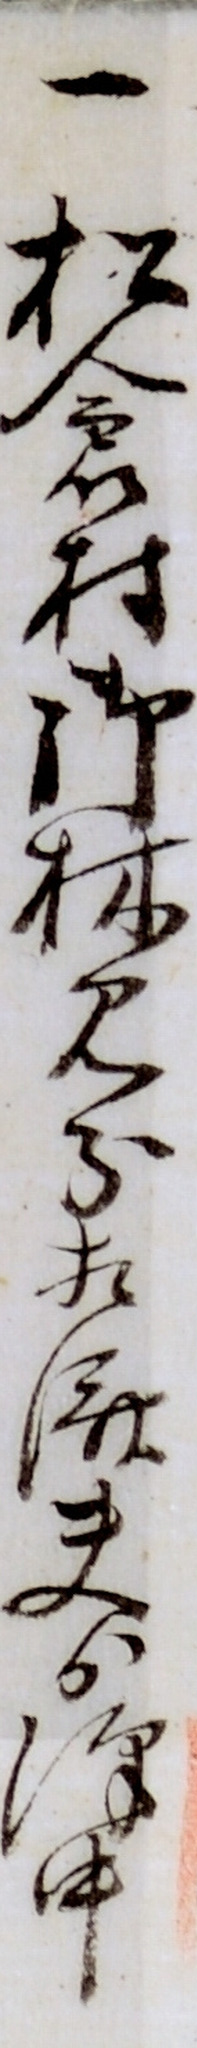一松倉村御林見分相済夫ゟ沢中
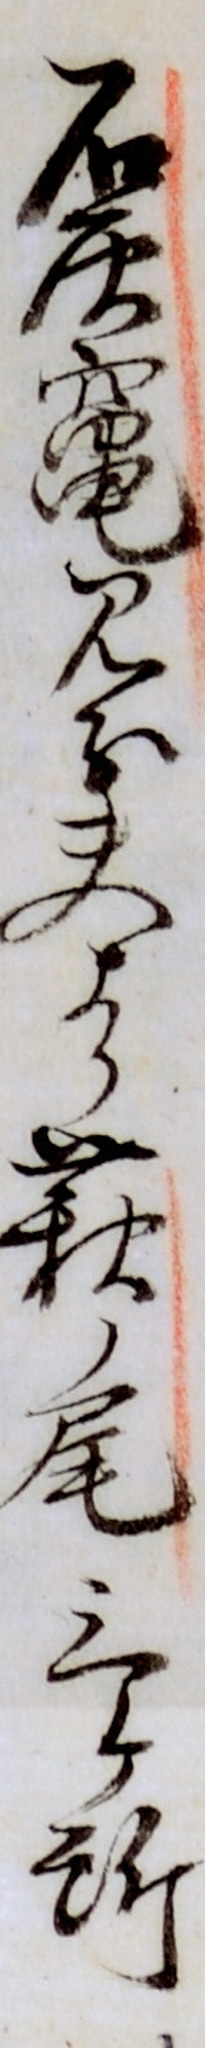石灰竃見分夫より萩ノ尾三ヶ所
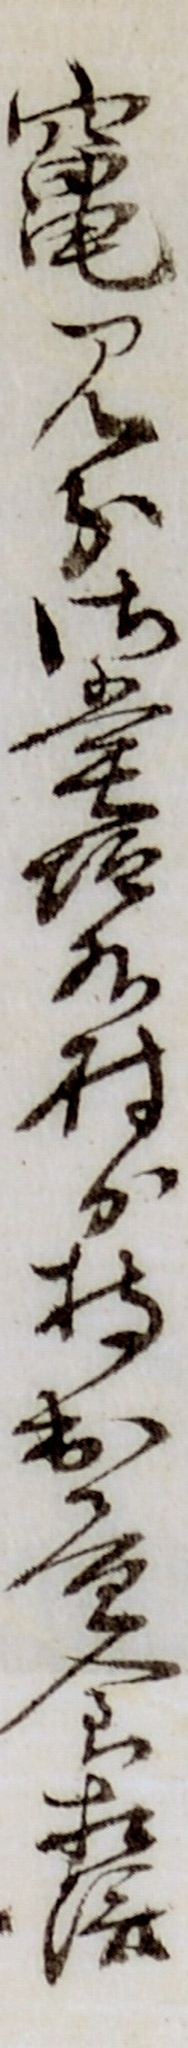竃見分御堂垣外村ゟ持出昼食相済
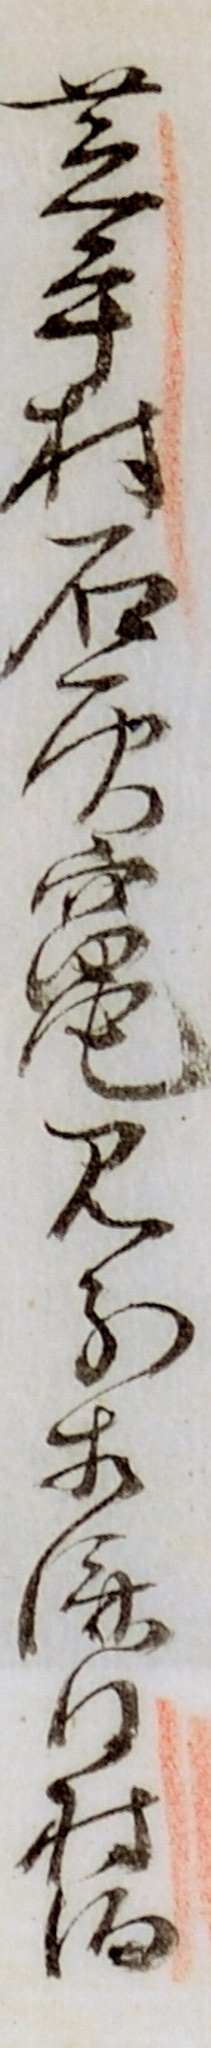芝平村石灰竃見分相済同村泊
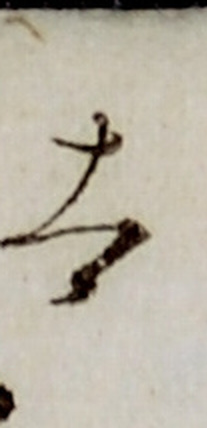十一日
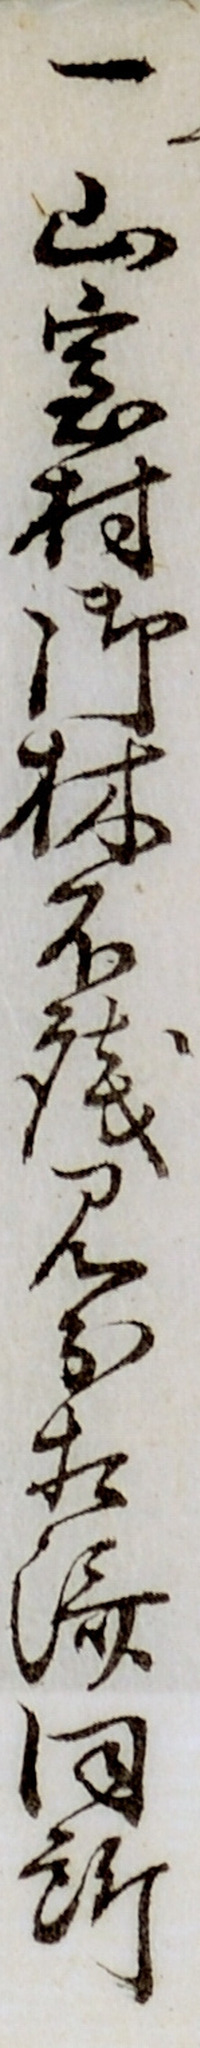一山室村御林不残見分相済同所
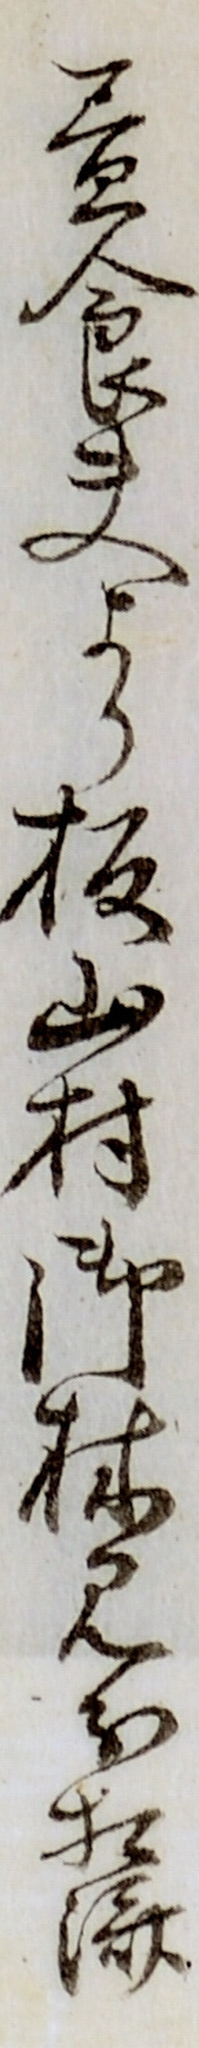昼食夫より板山村御林見分相済
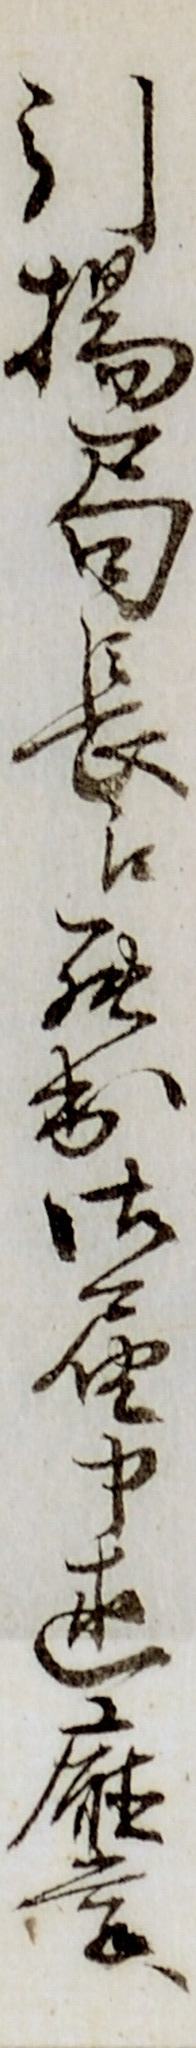引揚局長え罷出御届申述庁掌へ
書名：山林方諸事御用留
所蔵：伊那市立高遠町図書館・合同会社AMANE
